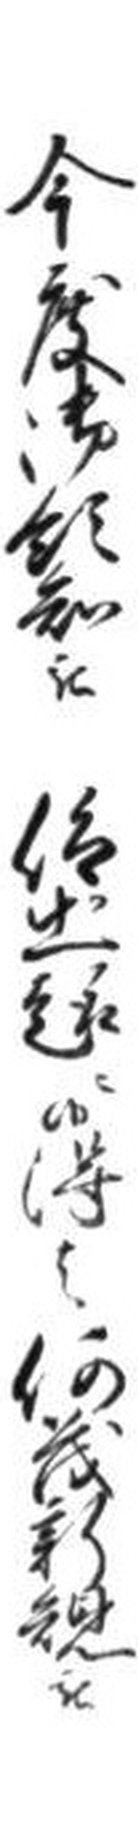今度御領知被仰出趣ニ候得者何茂新規被
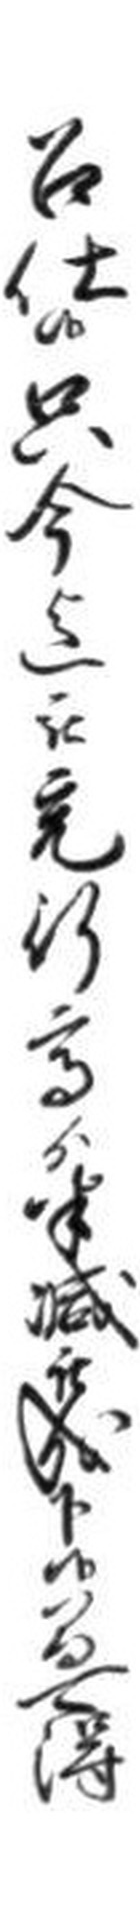召仕候只今迄被充行高ゟ半減被成下候間可得
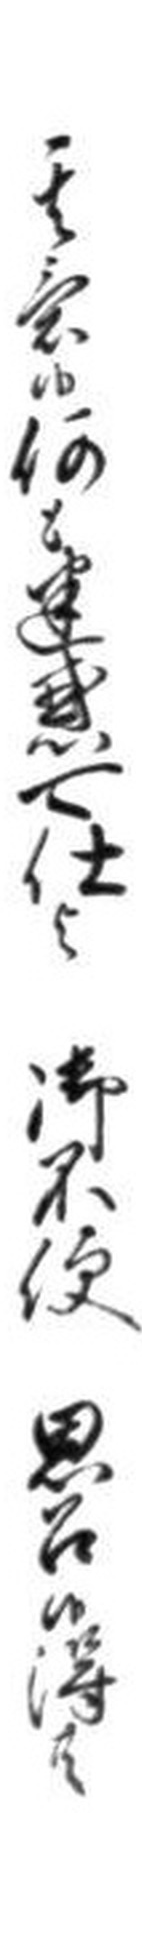其意候何も迷惑可仕与御不便思召候得共
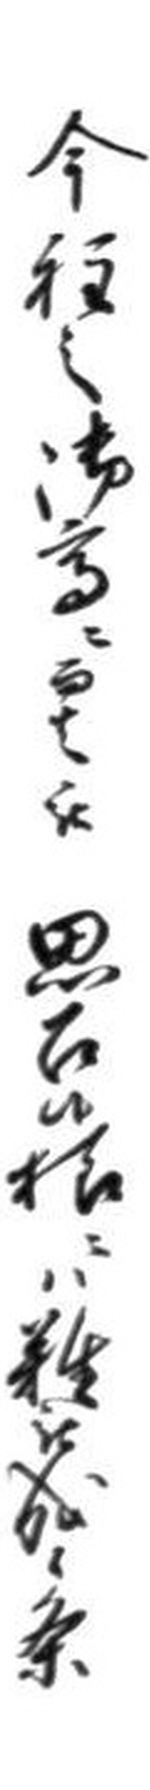今程之御高ニ而ハ被思召候様ニハ難被成候条
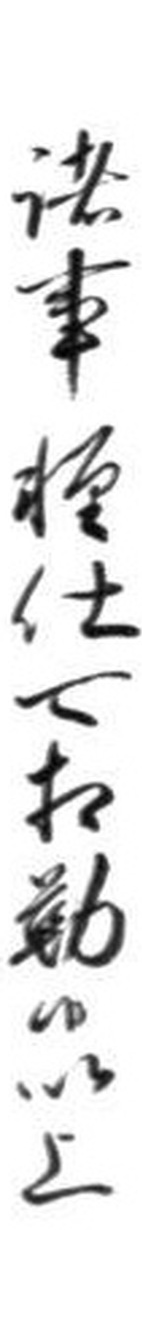諸事軽仕可相勤候以上
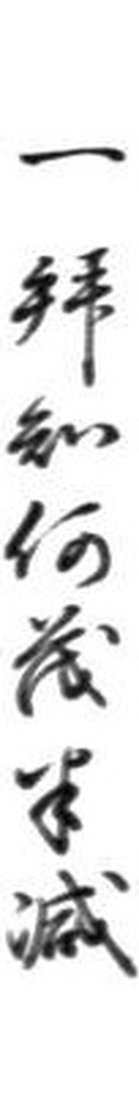一拝知何茂半減
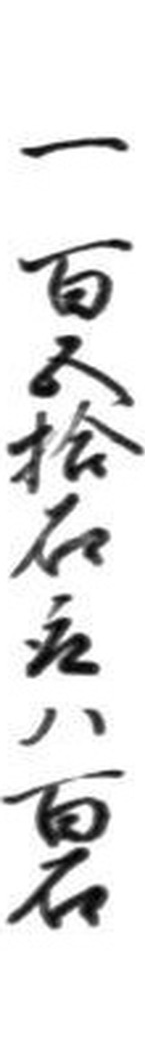一百五拾石取ハ百石
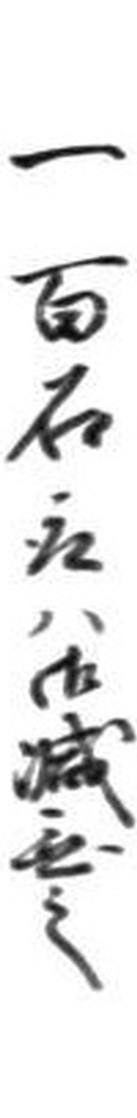一百石取ハ御減無之
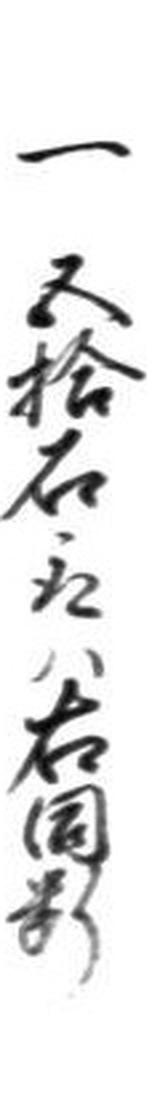一五拾石取ハ右同断
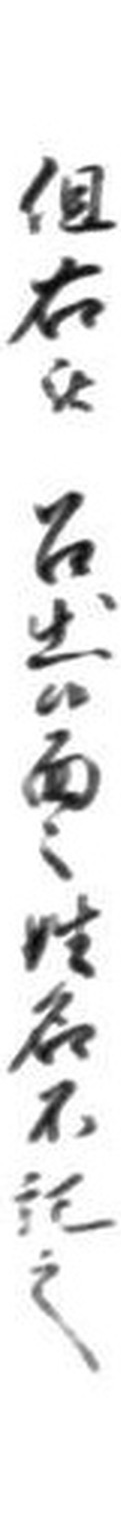但右被召出候面々姓名不記之

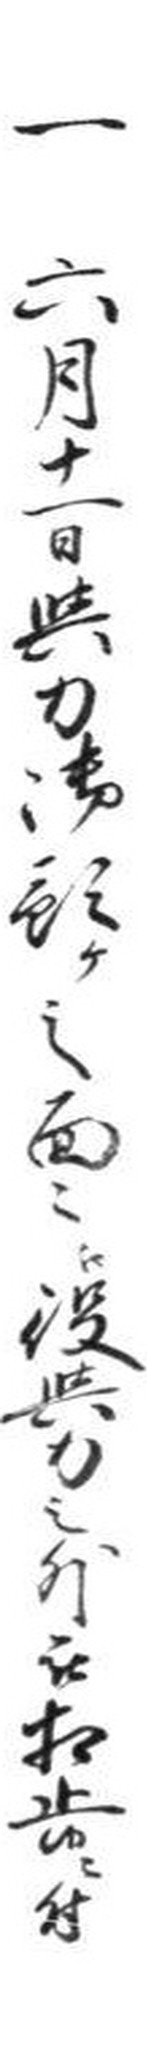一六月十一日与力御預ケ之面々江役与力之外被相止候ニ付
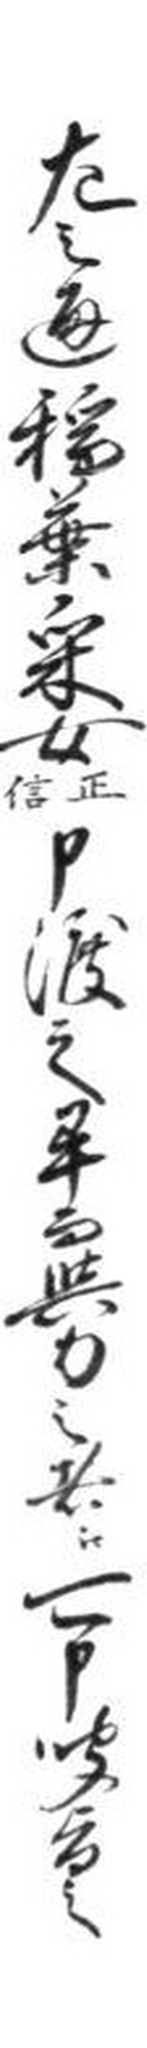左之通稲葉采女正信申渡之畢而与力之者江可申聞旨之
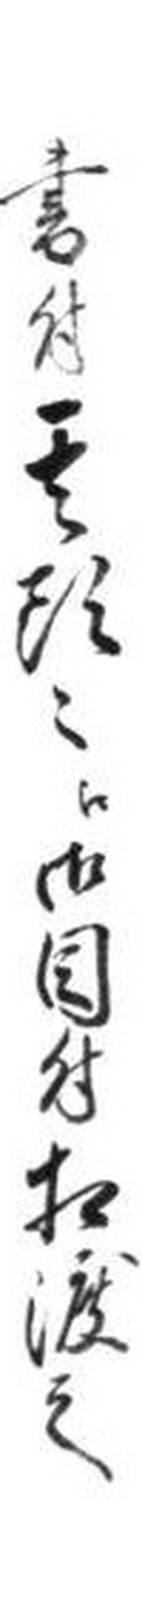書付其頭々江御目付相渡之
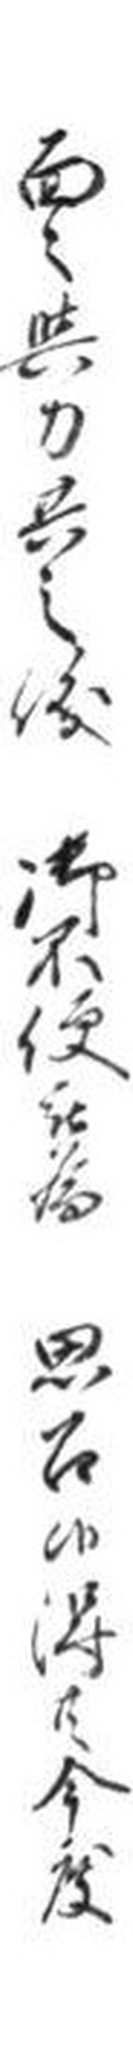面々与力共之儀御不便被為思召候得共今度
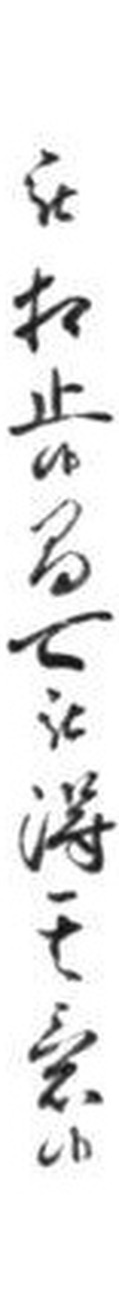被相止候間可被得其意候
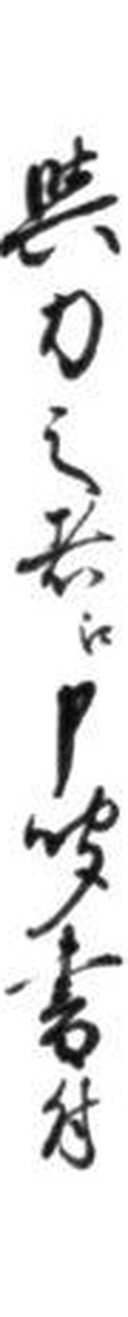与力之者江申聞書付
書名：家譜 十六 吉品公 従貞享三年閏三月到同四年
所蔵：福井県文書館 Fukui Prefectural Archives
